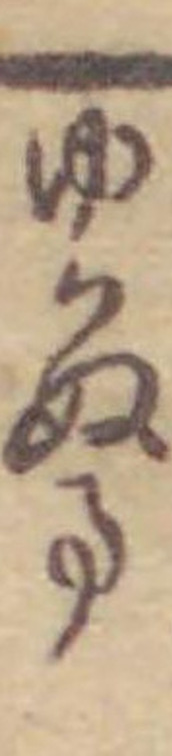ゆかぬ事
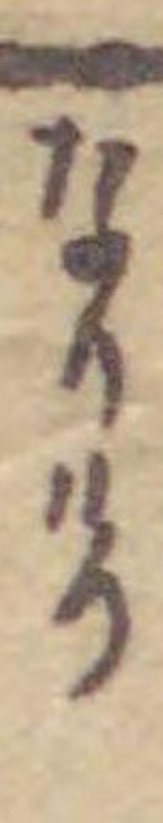なりけり
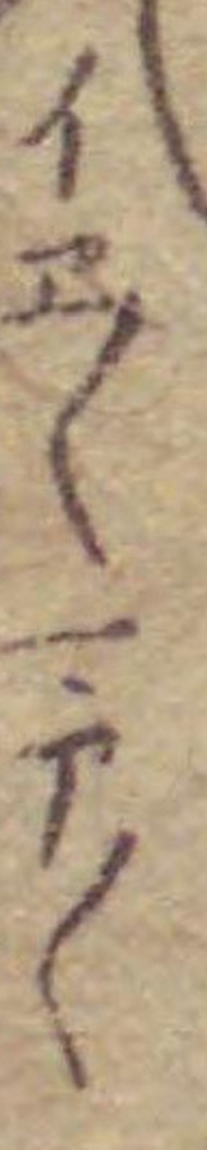イヱ〳〵マア〳〵
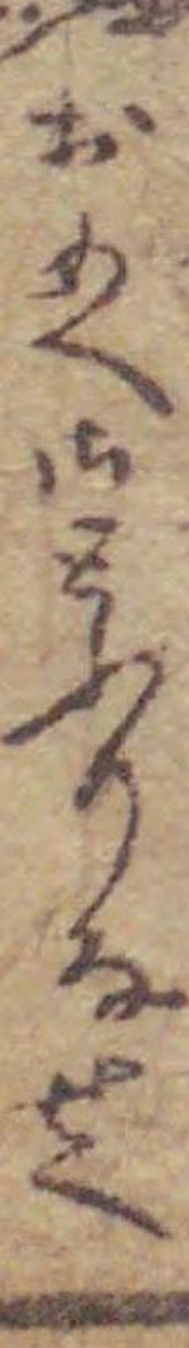おめへ御とふりなせへ

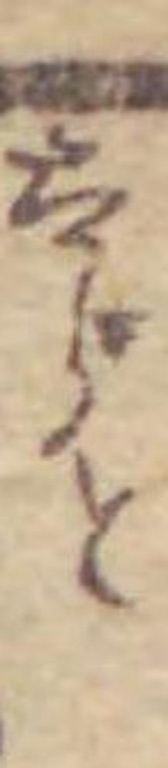太郎と
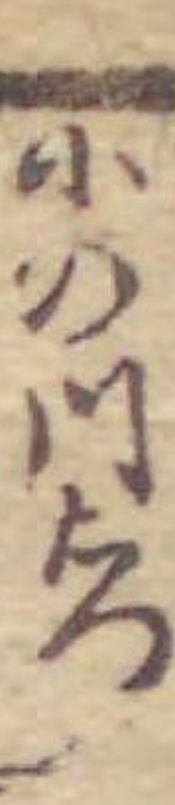小の川右衛門
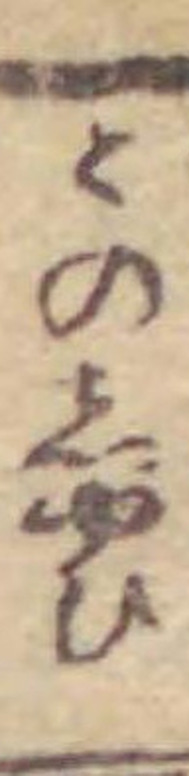とのしゆひ
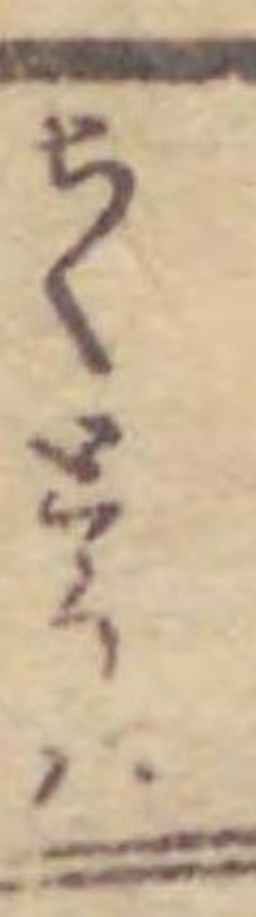ちくとうは
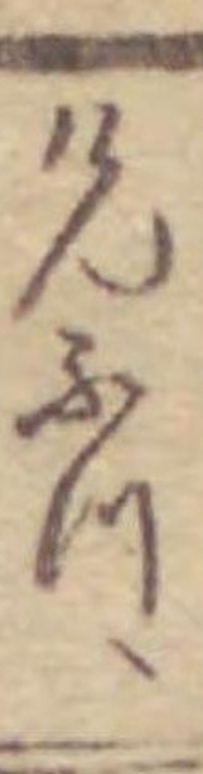けんふつへ
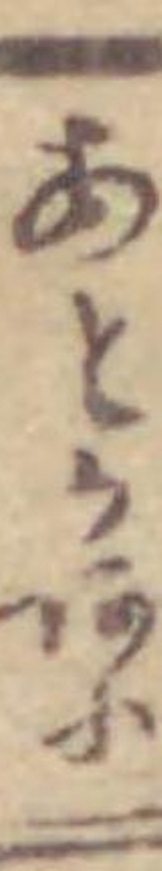あとかあふ
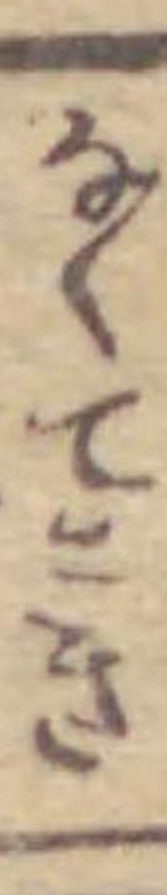なくてこき
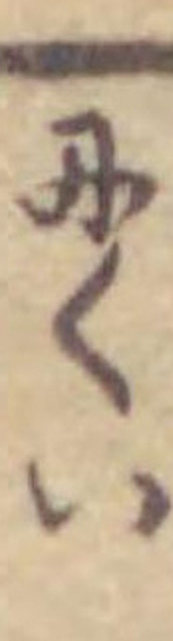にくい
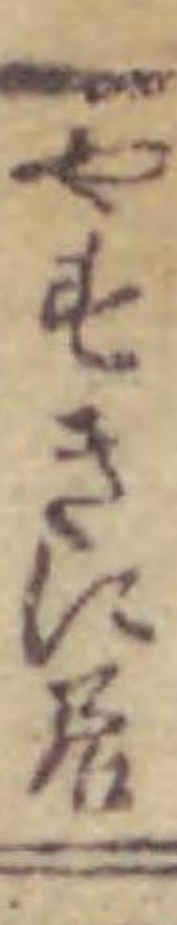やすきに居
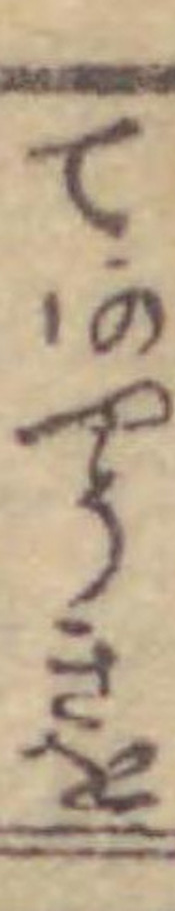てあやうきを
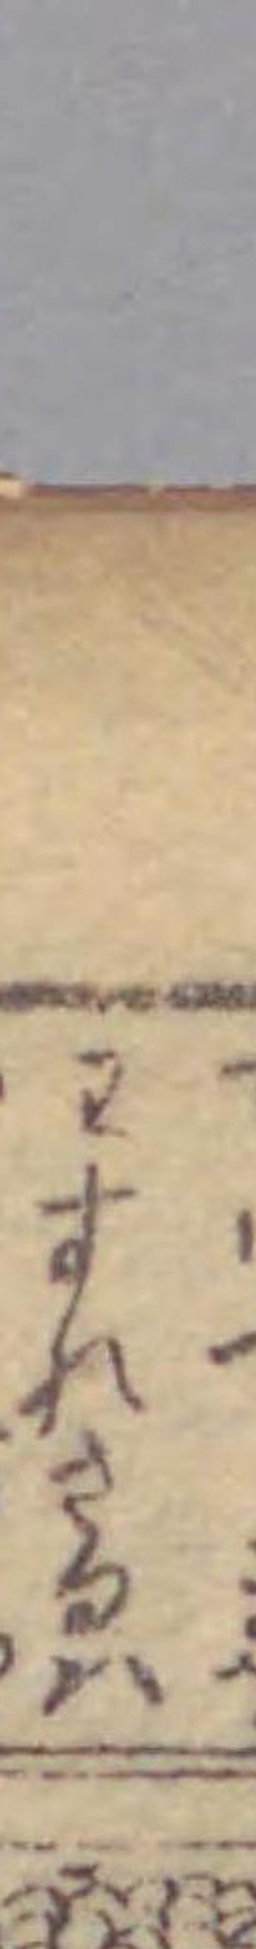わすれさるは
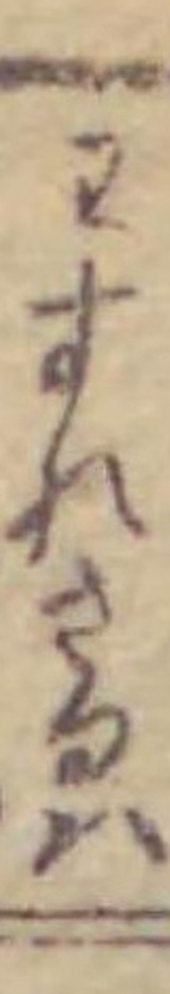わすれさるは
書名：天下一面鏡梅鉢 : 3巻
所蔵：国立国会図書館 National Diet Library, JAPAN
